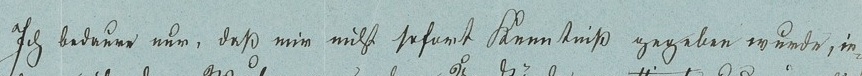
Ich bedaure nur, daß mir nicht sofort Kenntniß gegeben wurde, in-
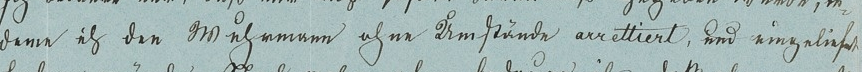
deme ich den Wuhrmann ohne Umstände arretiert, und eingeliefert
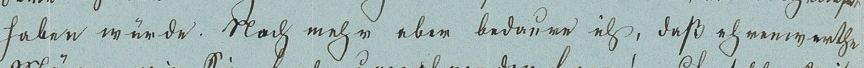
haben würde. Noch mehr aber bedaure ich, daß ehrenwerthe
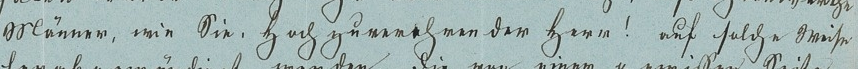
Männer, wie Sie, Hochzuverehrender Herr! auf solche Weise
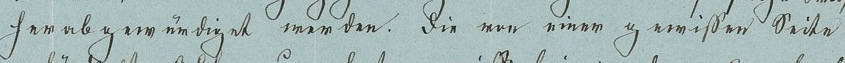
herabgewürdigt werden. Die von einer gewissen Seite
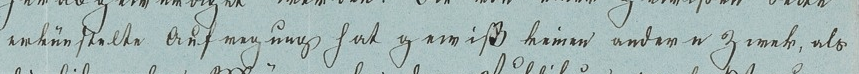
erkünstelte Aufregung hat gewiß keinen andern Zwek, als
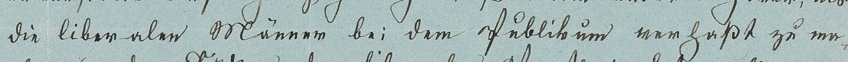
die liberalen Männer bei dem Publikum verhaßt zu ma-
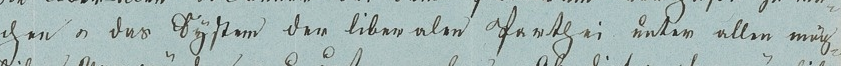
chen & das System der liberalen Parthei unter allen mög-
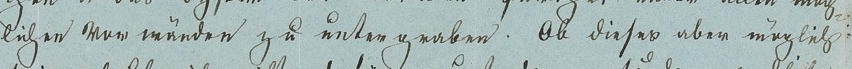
lichen Umständen zu untergraben. Ob dieses aber möglich
